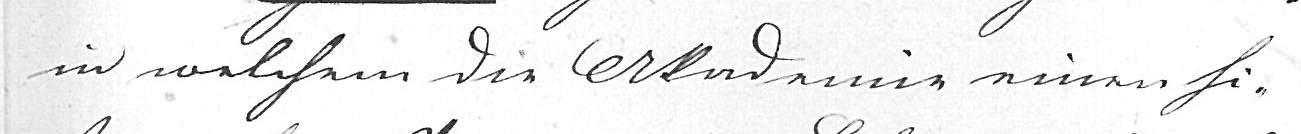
in welchem die Akademie einen hi-
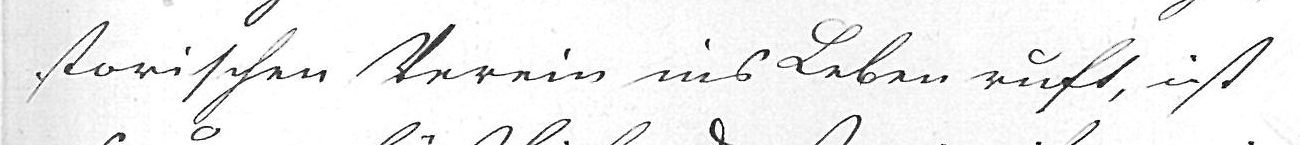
storischen Verein uns Leben rufe, ist
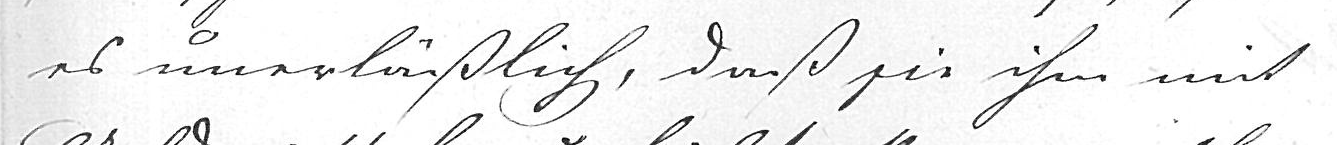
es unerläßlich, daß sie ihm mit
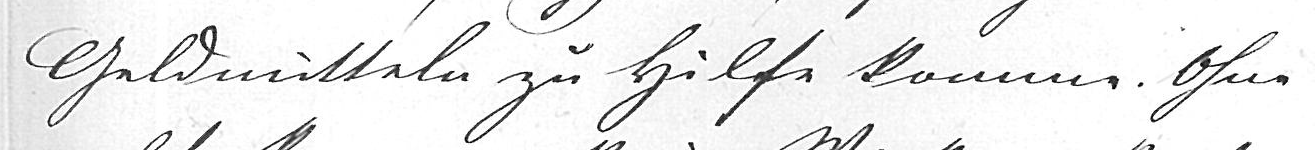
Geldmitteln zu Hilfe komme. Ohne
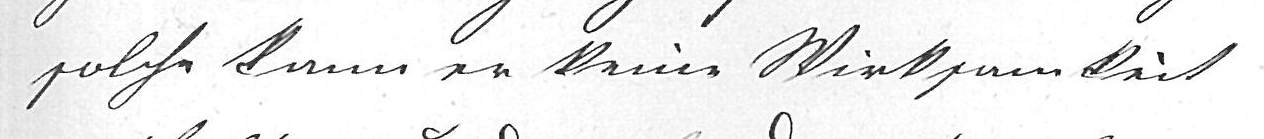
solche kann er keinen Wirksamkeit
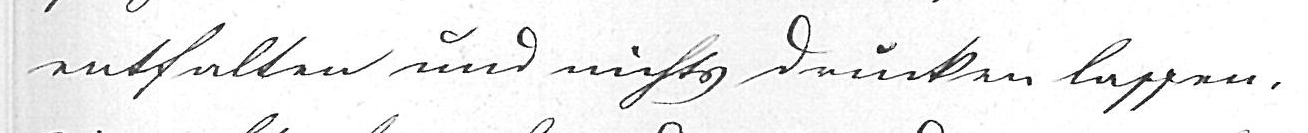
entfalten und nichts drucken lassen.
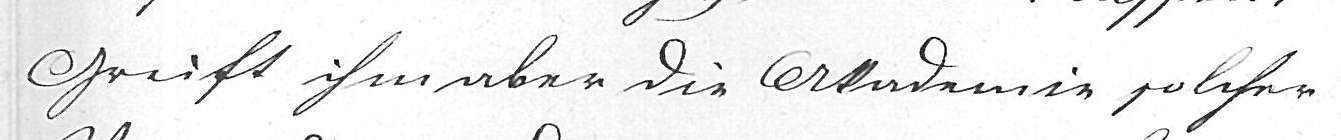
Greift ihm aber die Akademie solcher
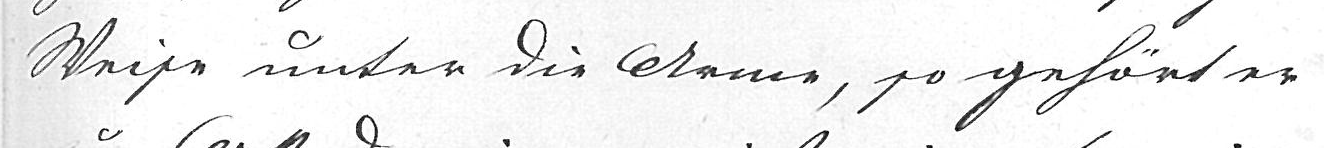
Weise unter die Arme, so gehört er
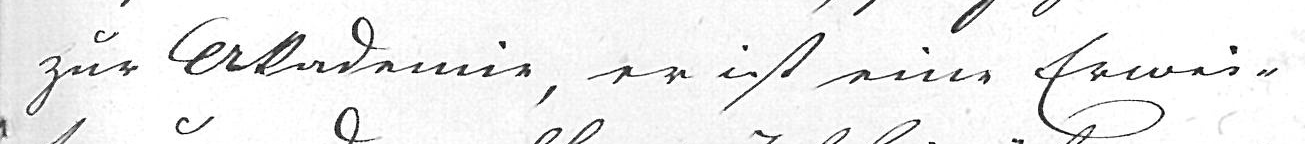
zur Akademie, er ist eine Erwei-
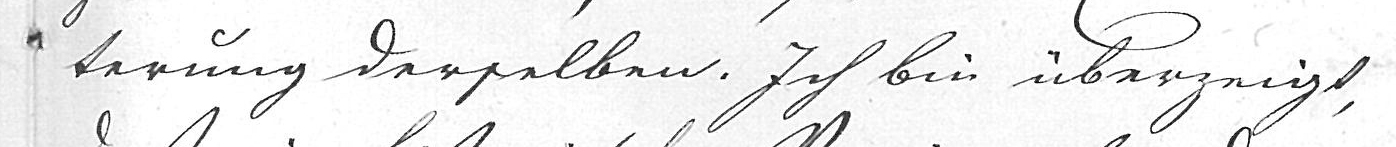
terung derselben. Ich bin überzeugt,
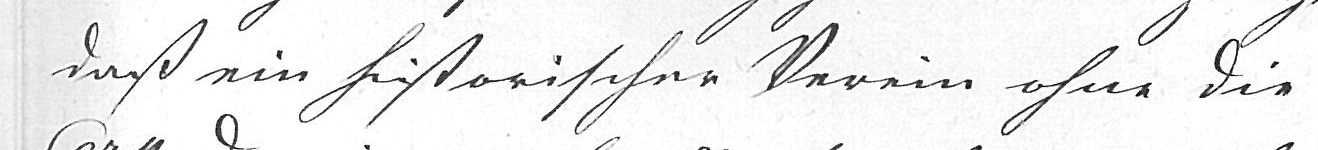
daß ein historischer Verein ohne die-
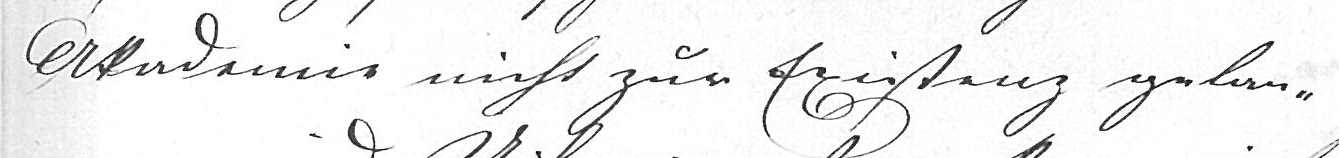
Akademie nicht zur Existenz gelan-
